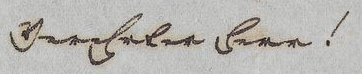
Verehrter Herr!
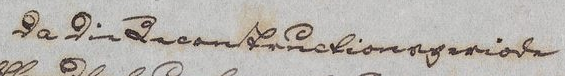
Da die Reconstructionsperiode
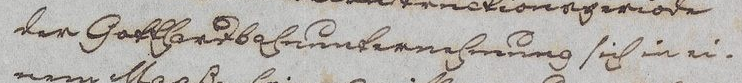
der Gotthardbahnunternehmung sich in ei-
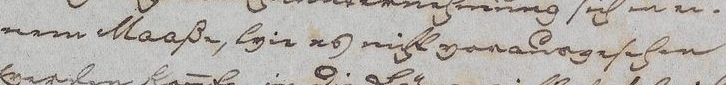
nem Maaße, wie es nicht vorausgesehen
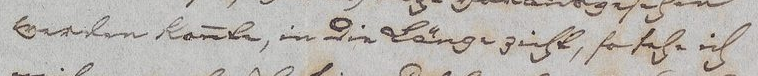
werden konnte, in die Länge zieht, so sehe ich
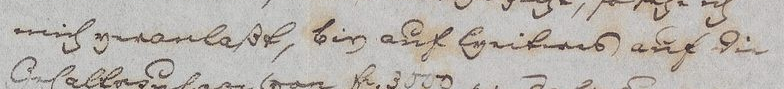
mich veranlaßt, bis auf weiteres auf die
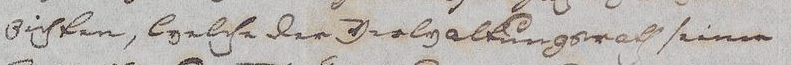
zichten, welche der Verwaltungsrath seiner
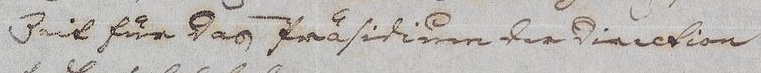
Zeit für das Präsidium der Direction
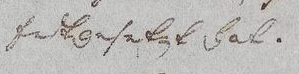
festgesetzt hat.
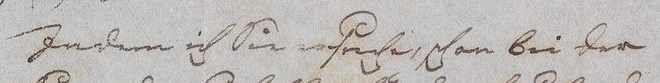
Indem ich Sie ersuche, schon bei der
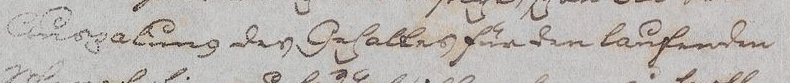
Auszalung des Gehaltes für den laufenden
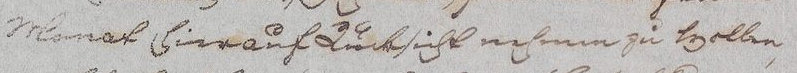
Monat hierauf Rücksicht nehmen zu wollen,
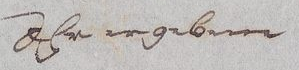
Ihr ergebene
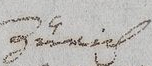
Zürich
